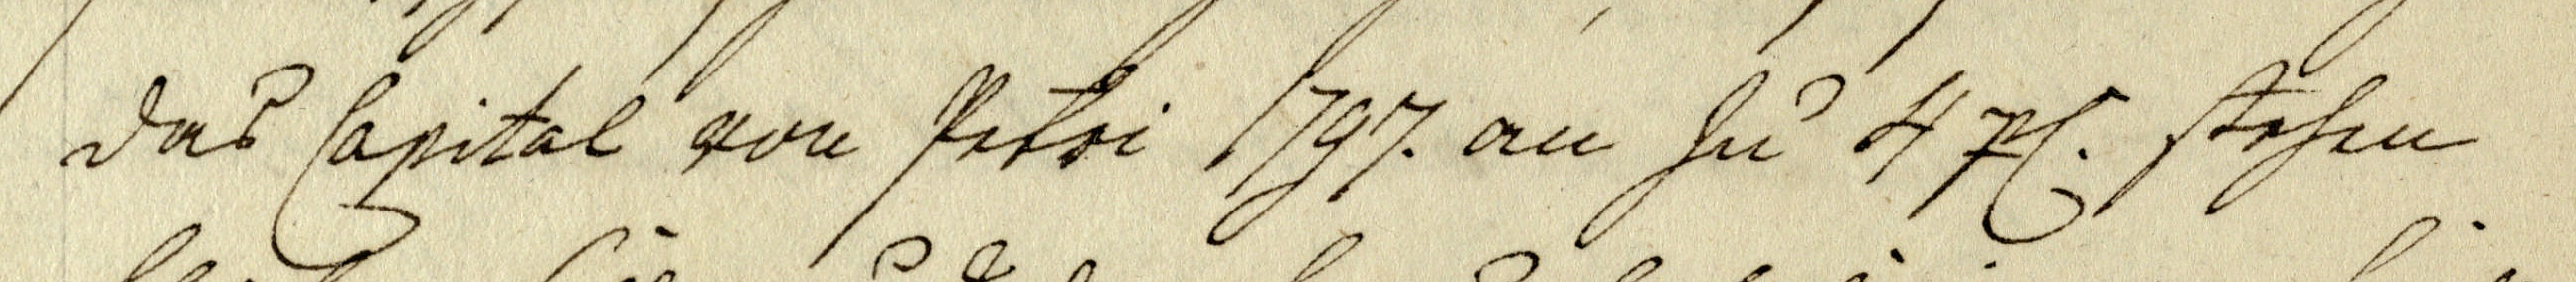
das Capital von Petri 1797. an zu 4 pl. stehen
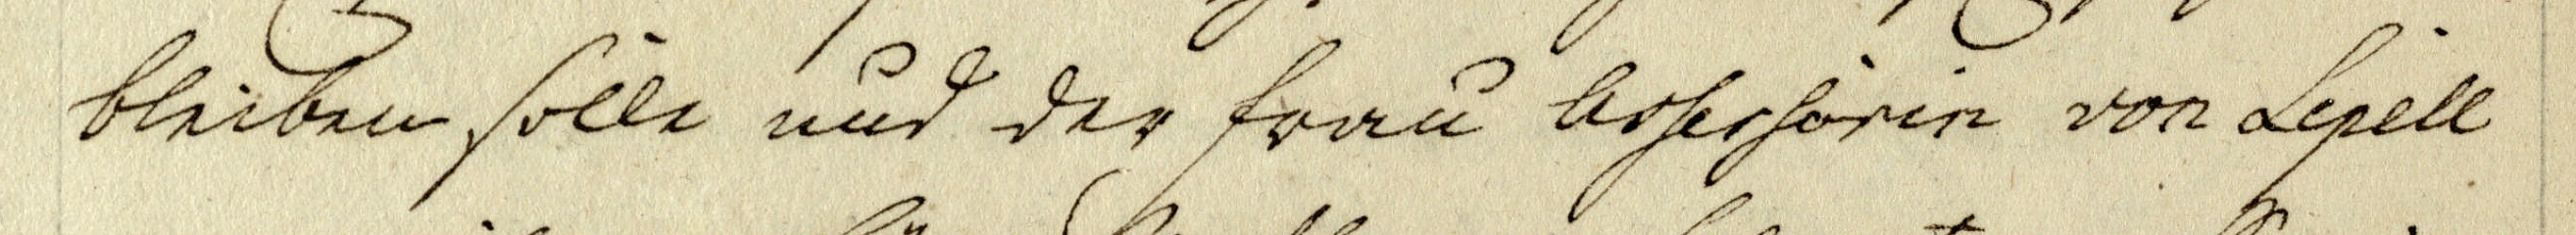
bleiben solle und der Frau Assessorin von Lepell
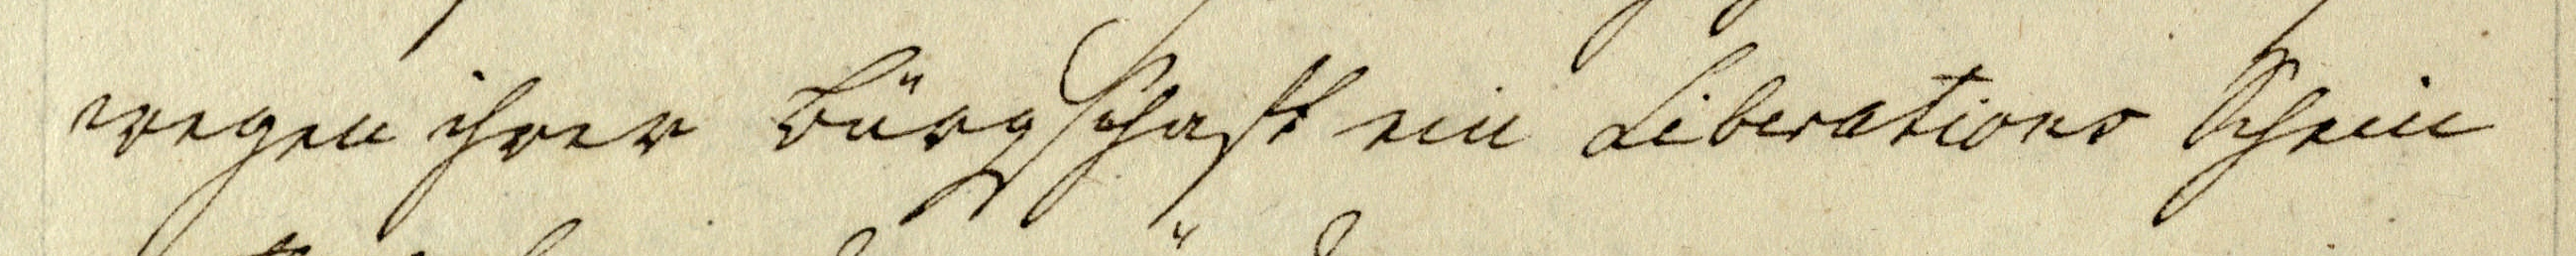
wegen ihrer Bürgschaft ein Liberations Schein
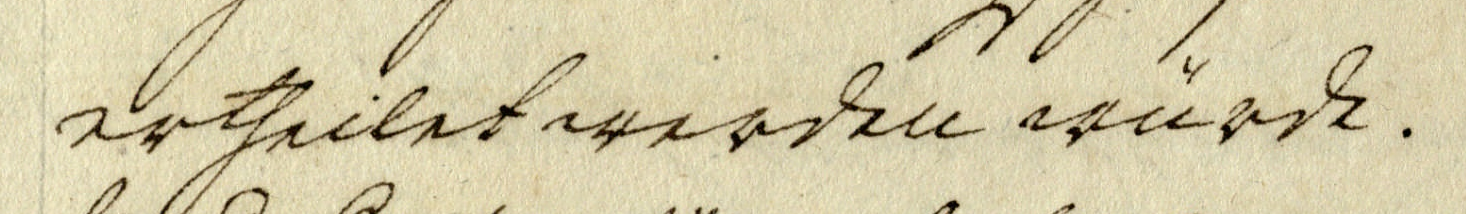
ertheilet werden würde.
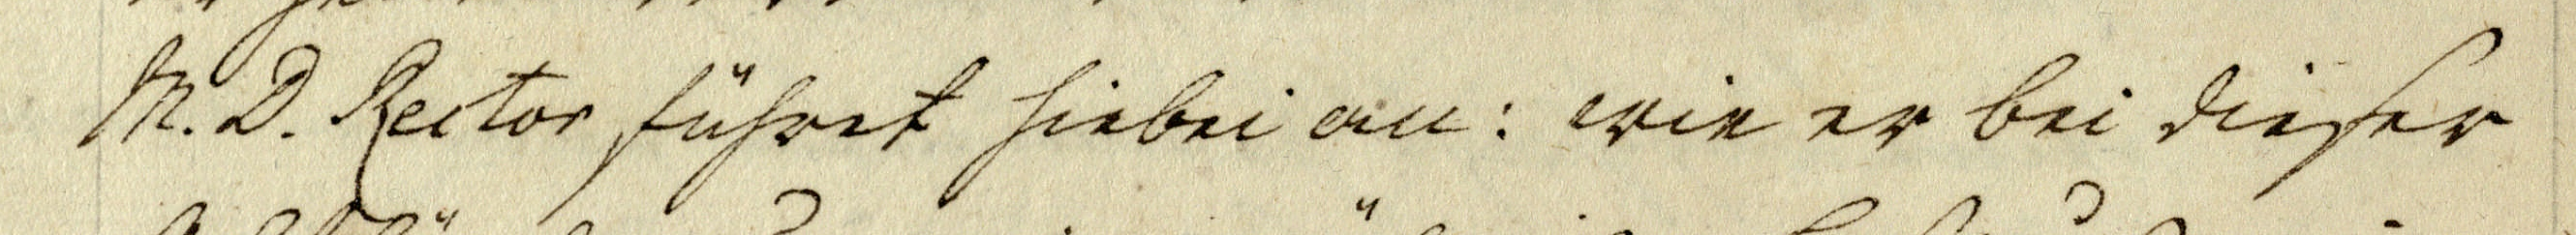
M. D. Rector führet hiebei an: wie er bei dieser
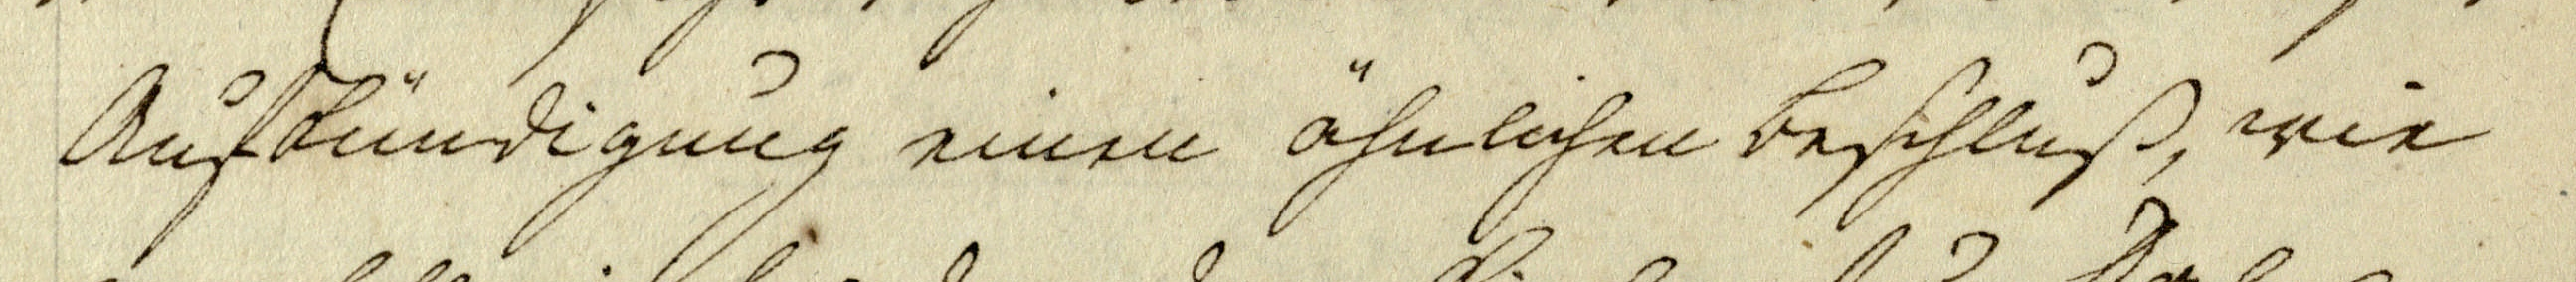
Aufkündigung einen ähnlichen Beschluß, wie
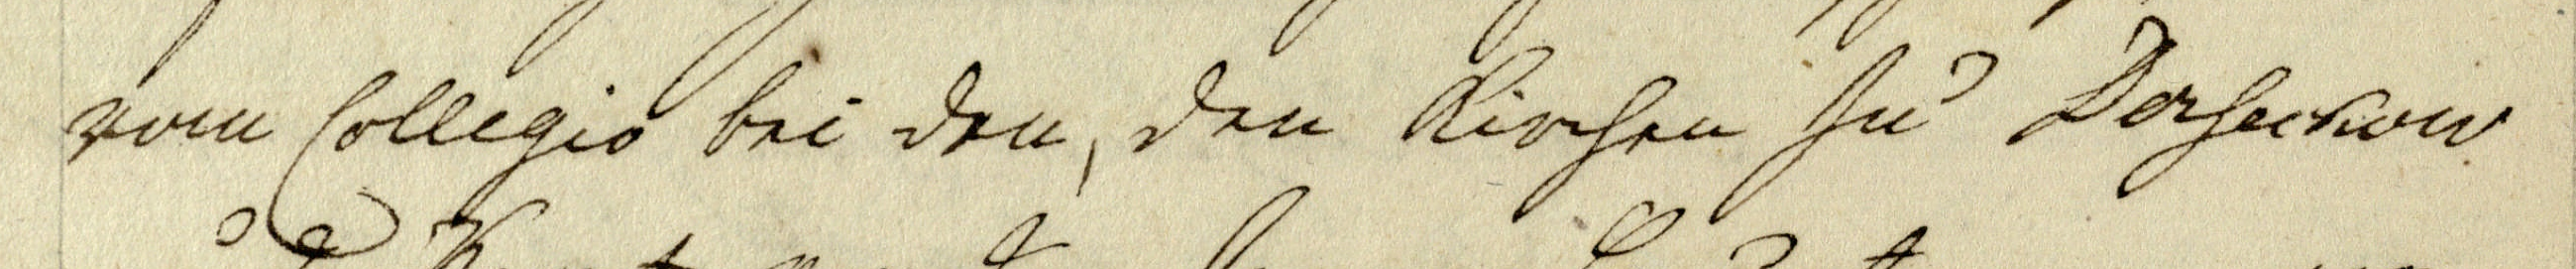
vom Collegio bei den, den Kirchen zu Derseckow
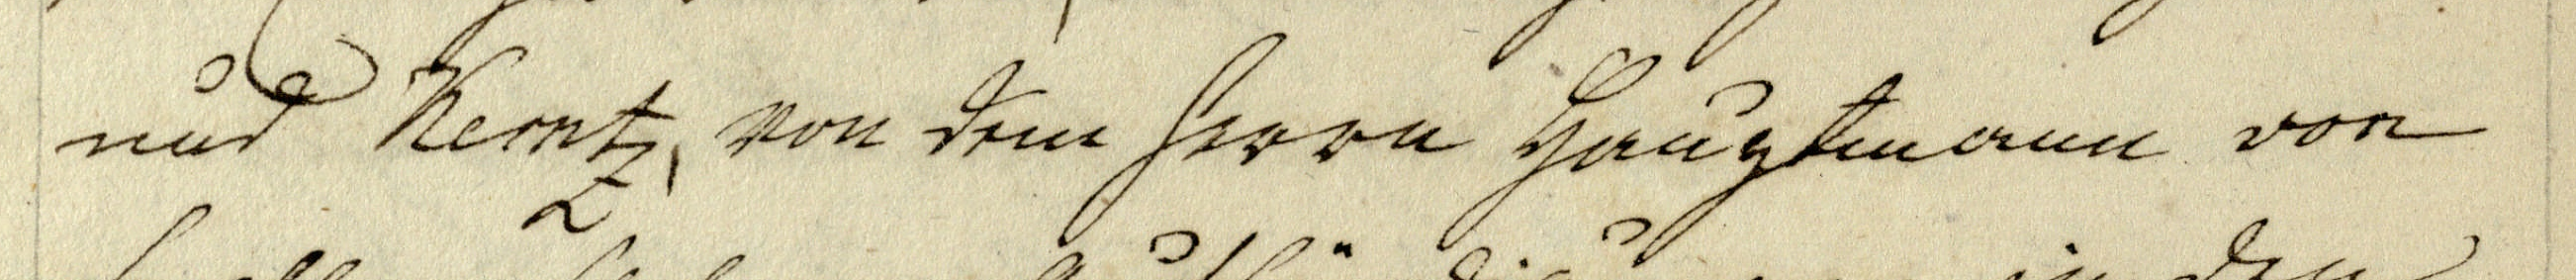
und Kemtz, von dem Herrn Hauptmann von
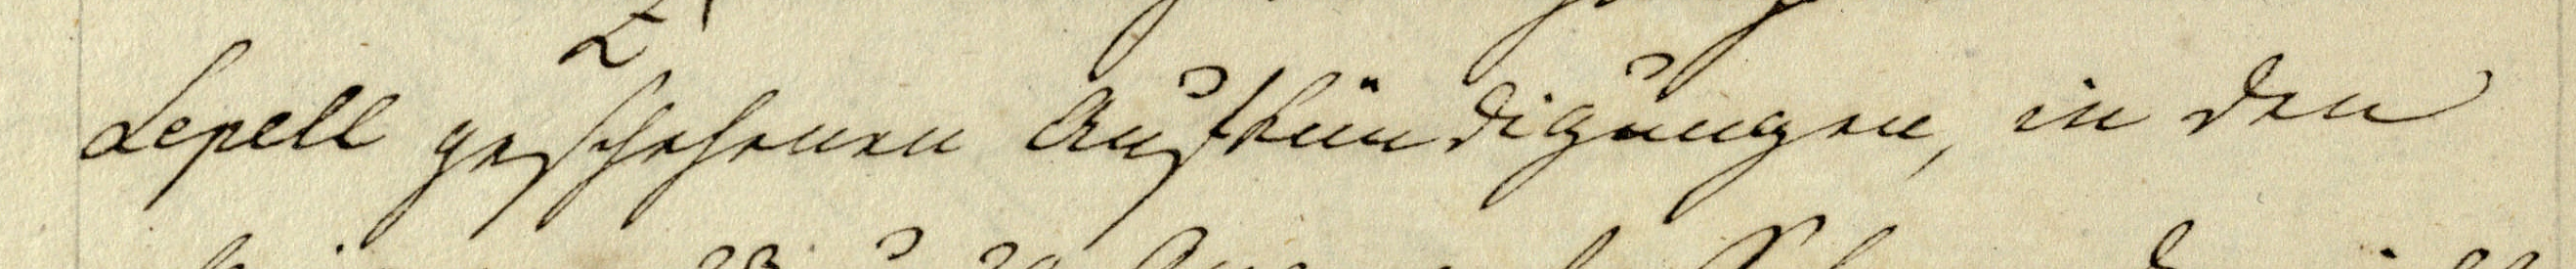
Lepell geschehenen Aufkündigungen, in den
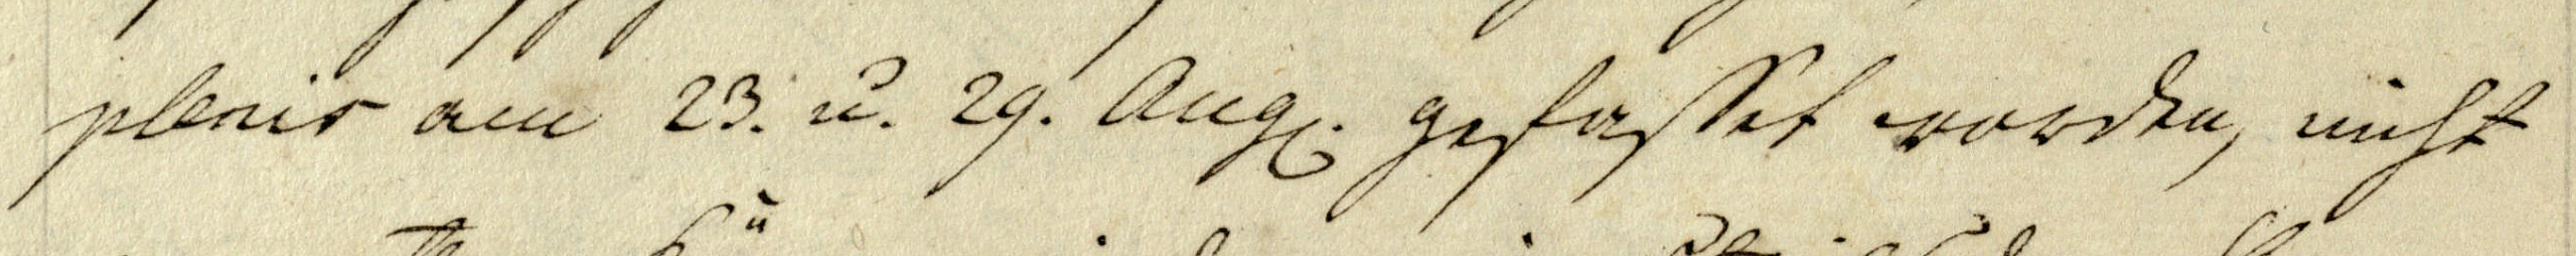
plenis am 23. u. 29. Aug. gefasset worden, nicht
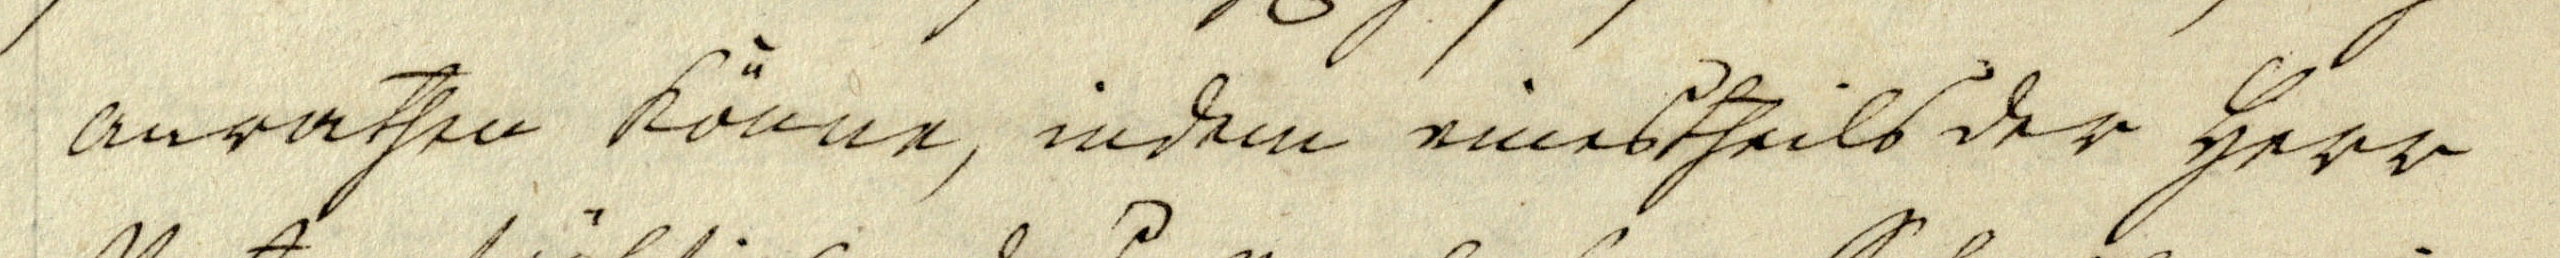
anrathen könne, indem einestheils der Herr
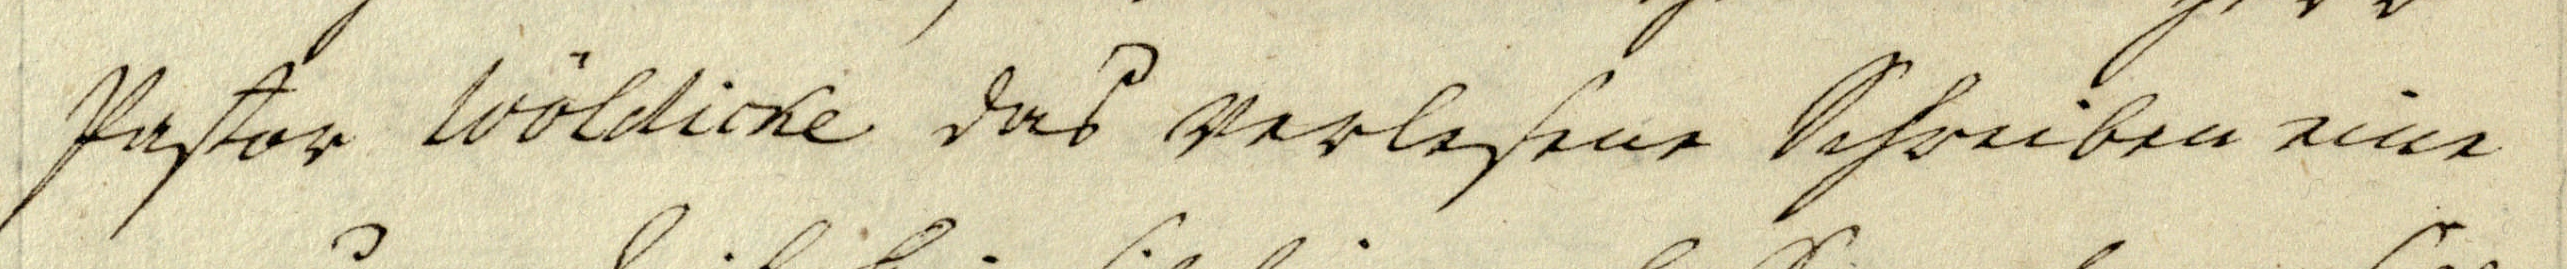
Pastor Wöldicke das verlesene Schreiben eine
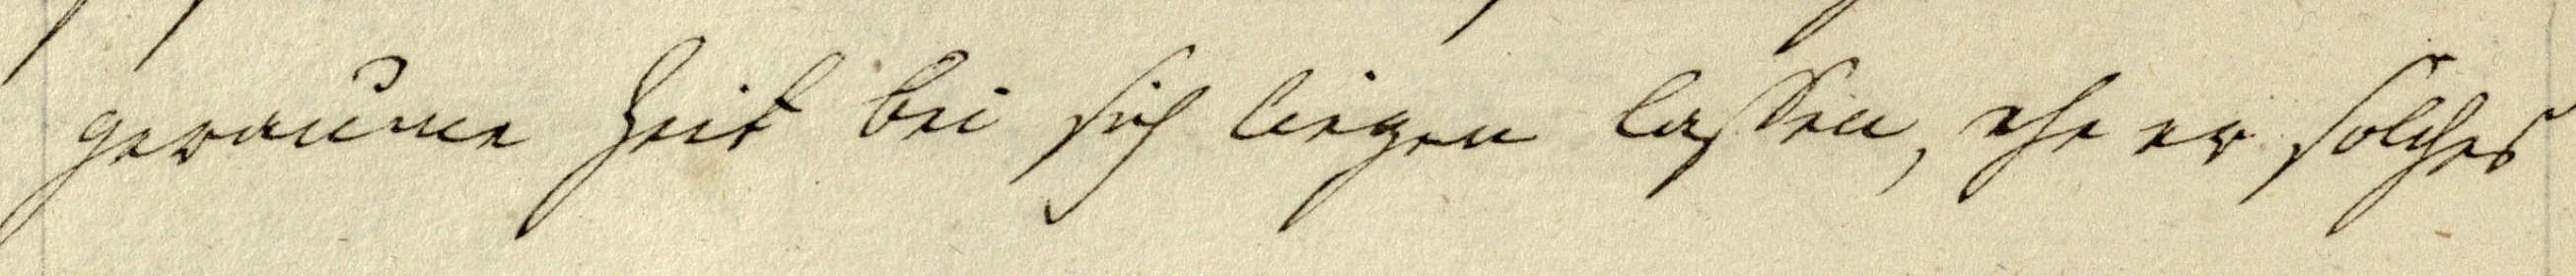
geraume Zeit bei sich liegen lassen, ehe er solches
